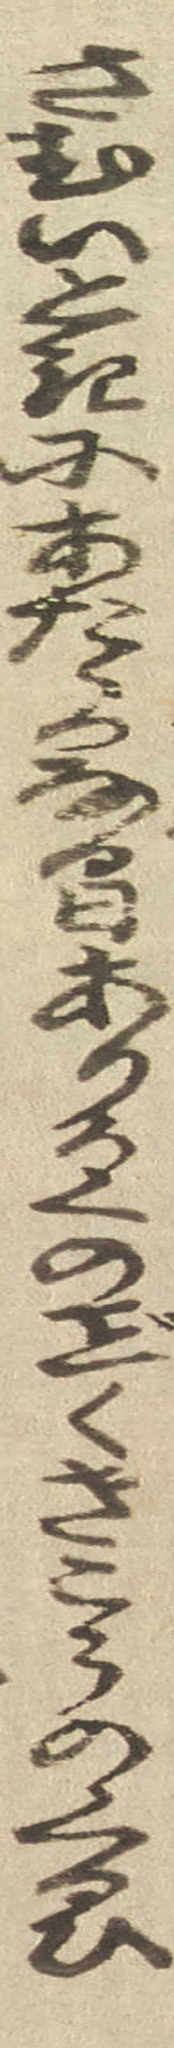さむいときにあたゝかなる日ありかくのごとくきこうのくるひ
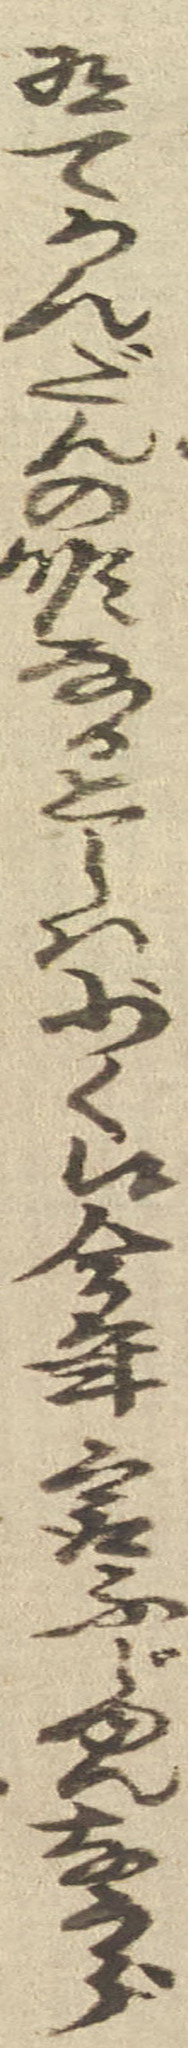有てかんだんの順なるとしは少く候今年最ふじゆんなから
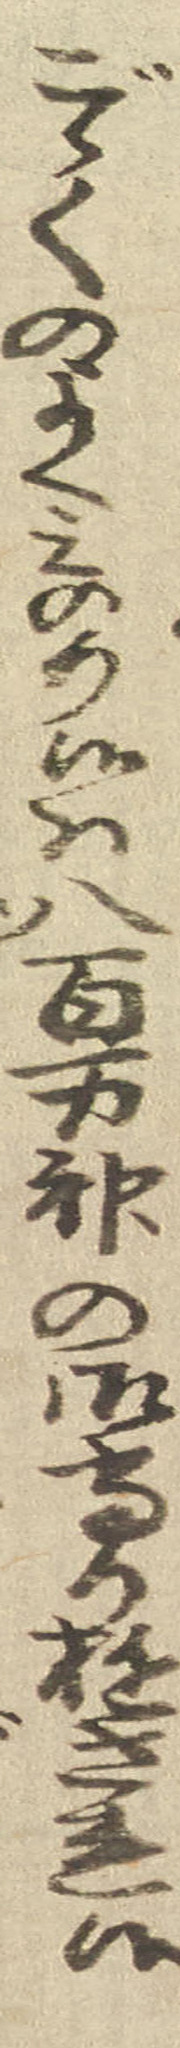ごゝくのよくみのり候は八百万神の御守り遊され候
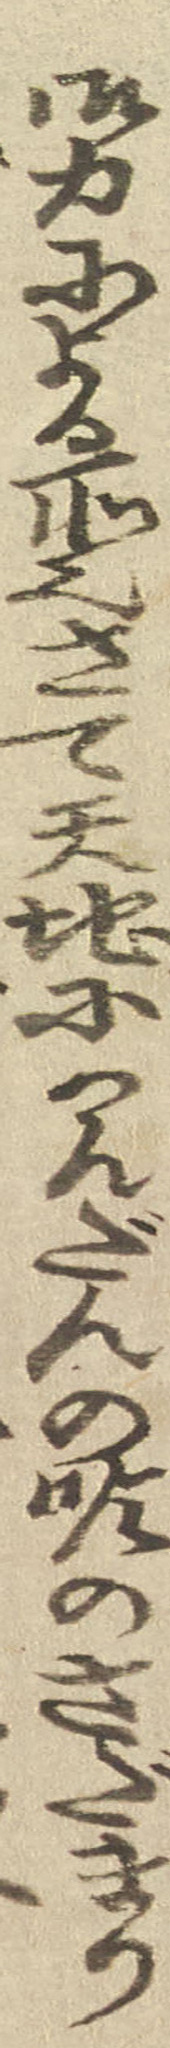御力による所也さて天地にかんだんの順のさだまり
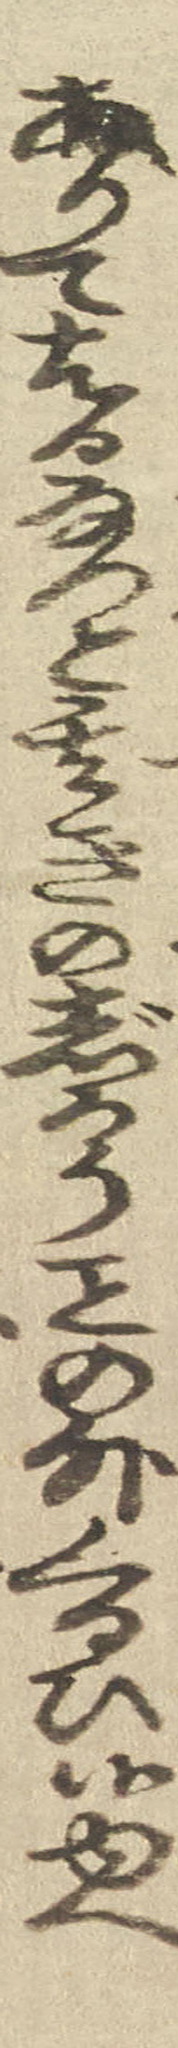ありてはるなつと其きのじかうことの外くるひ候ゆへ
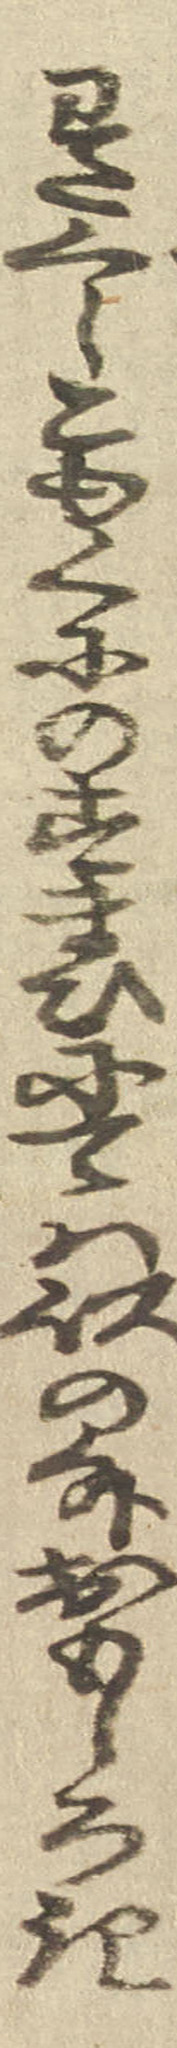わたくしともくにのすまひにては以の外おもしろき
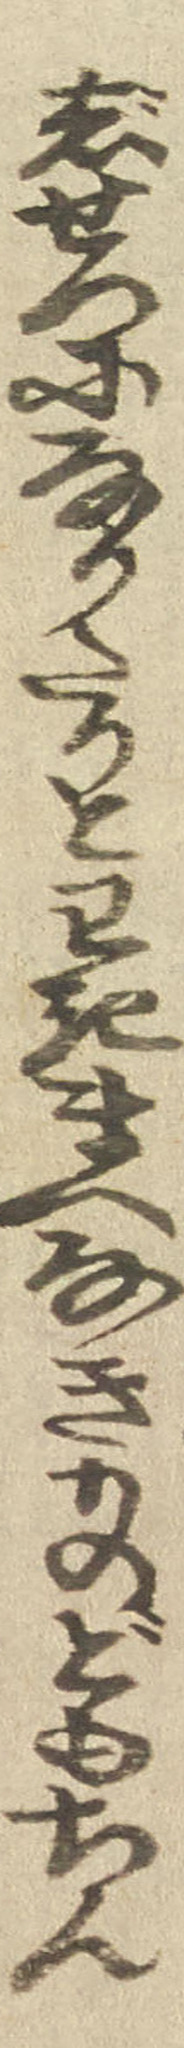じせつになりたりとわきまへなきものどもちん
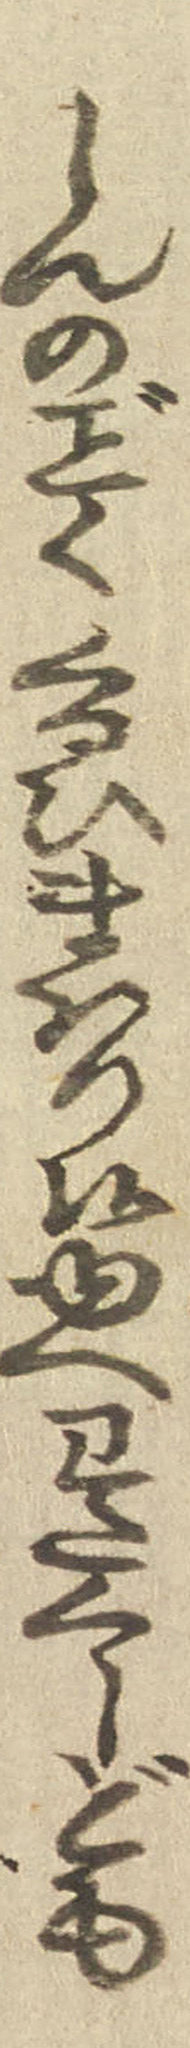しんのごとくくるひまはり候ゆへわたくしども
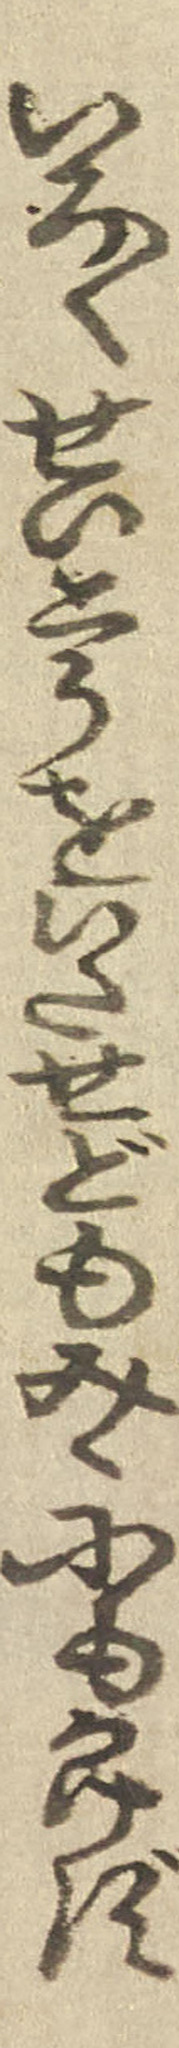いろ〳〵せいとうをいたせどもみゝにもかけず
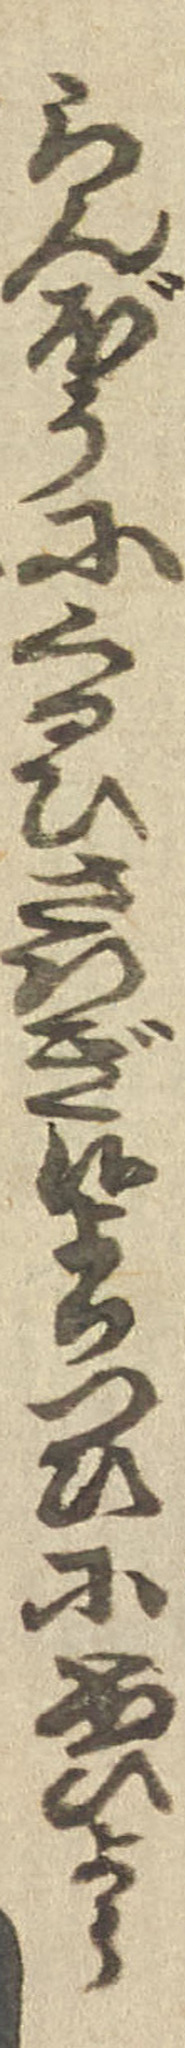らんぼうにくるひさはぎ候よりつひに思ひよら
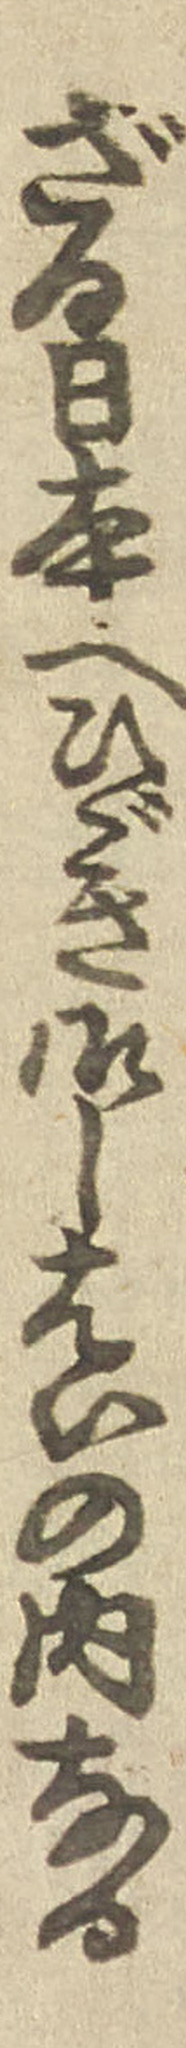ざる日本へひゞき御しはいの内なる
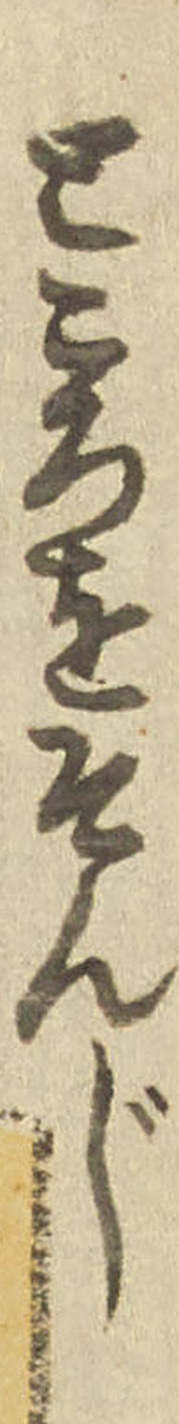ところをそんじ
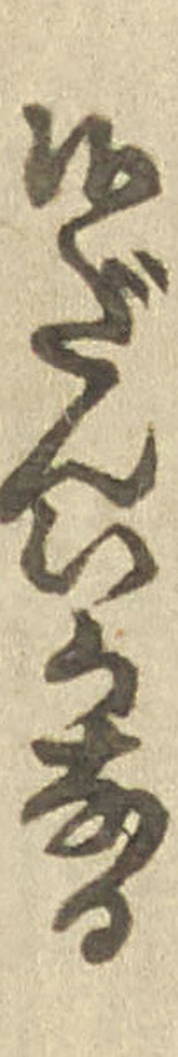候だんいかなる
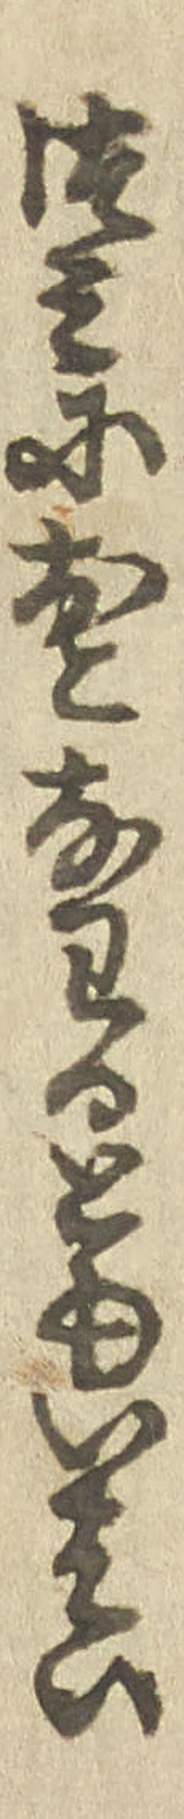つみにおこなわるともいはい
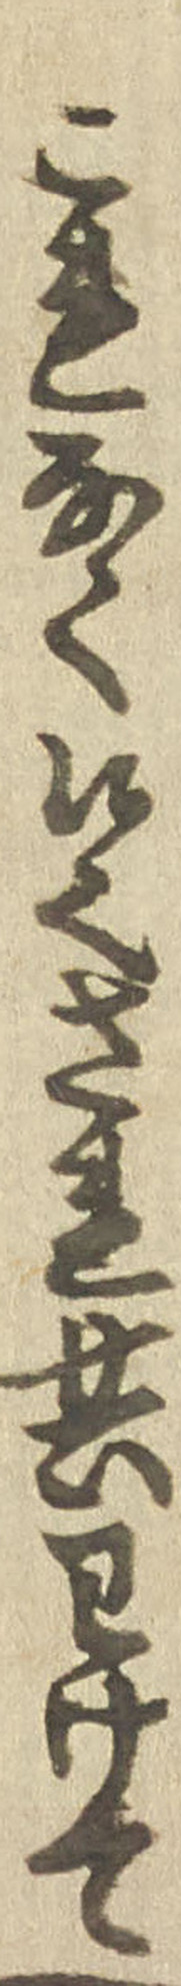これなく候也され共わけて
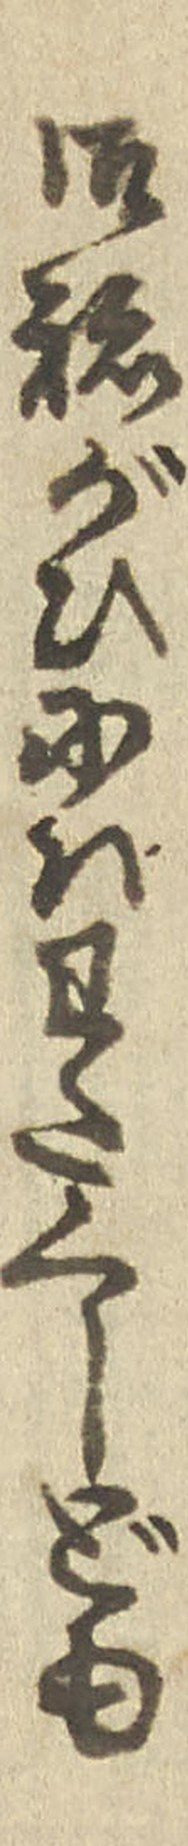御ねがひにはわたくしども
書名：恵比寿天申訳之記
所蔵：東京大学総合図書館 General Library in the University of Tokyo, JAPAN
